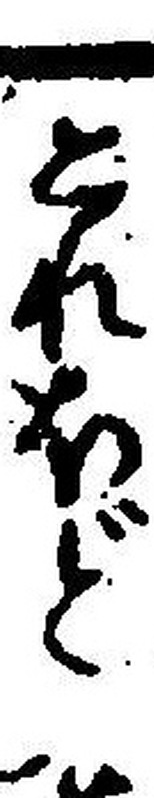とれほど
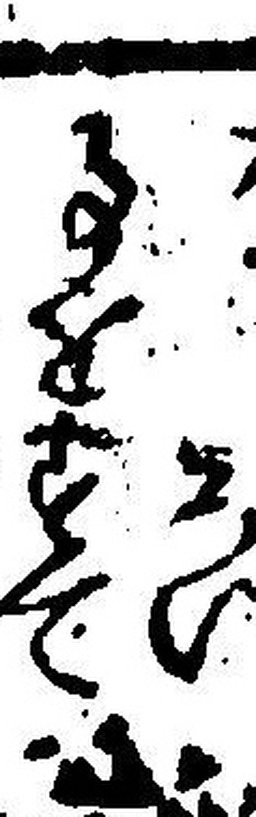事をすて
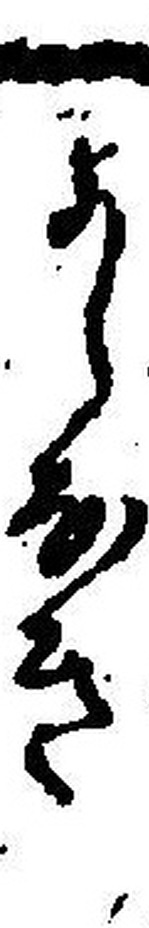よしなき
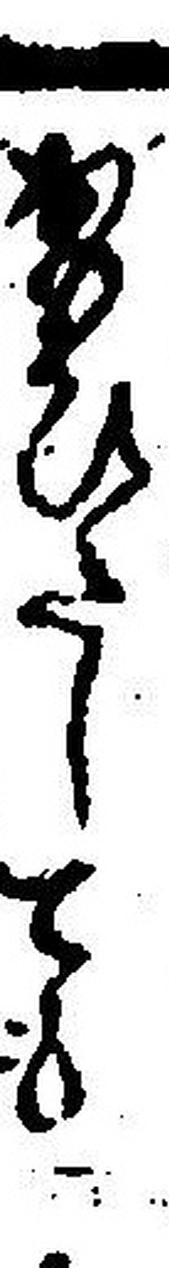おもひたしても
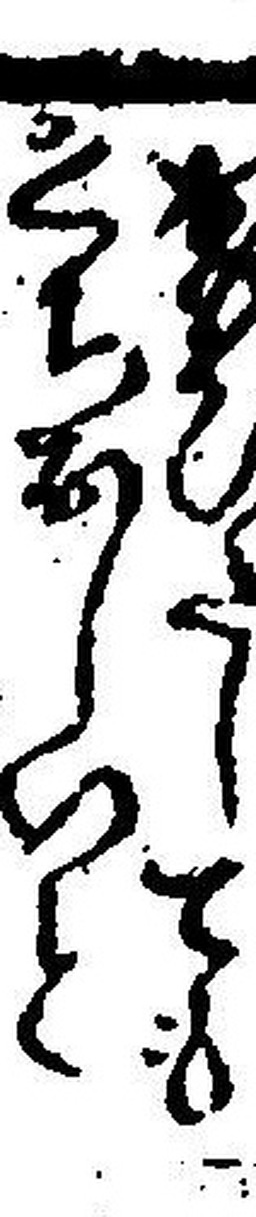くちおしいと
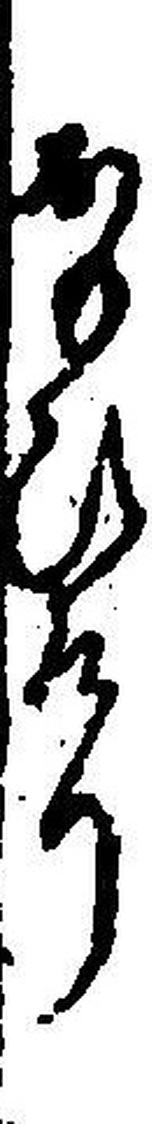おもひけり

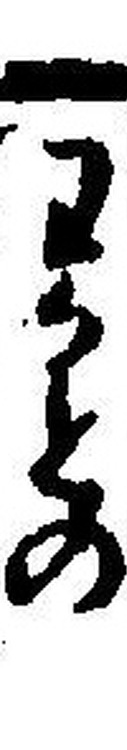わかとの
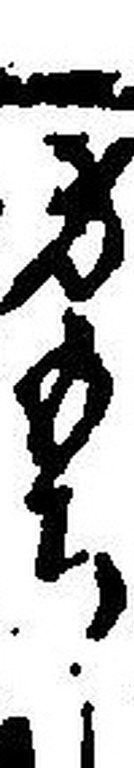身もち
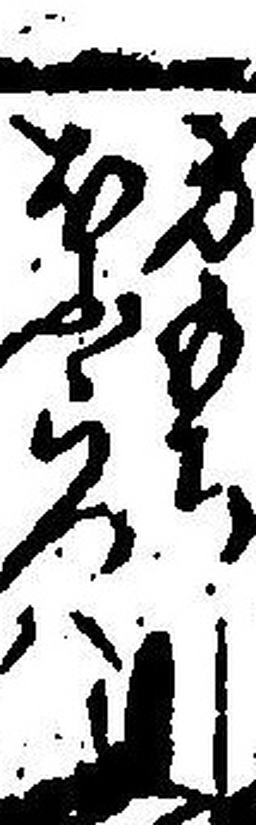ほふらつは
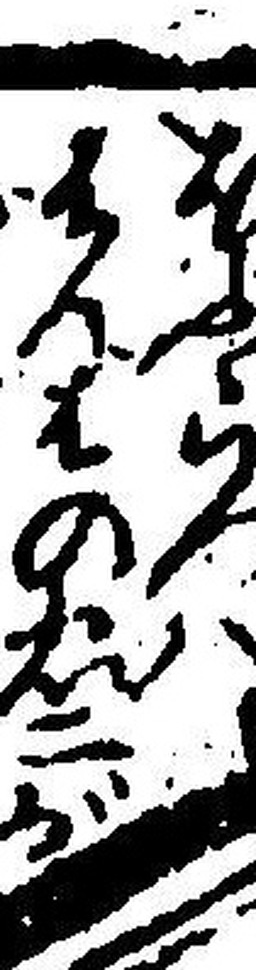はんはの忠二が
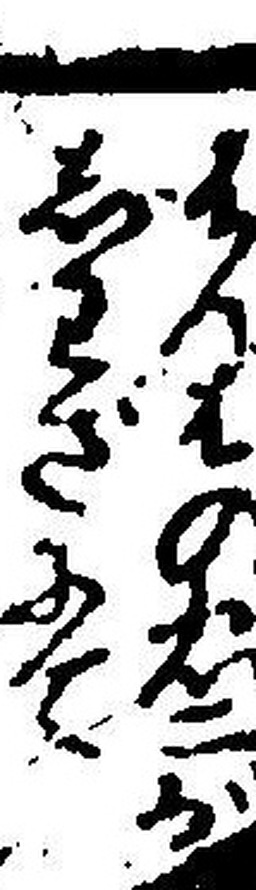しわざにて
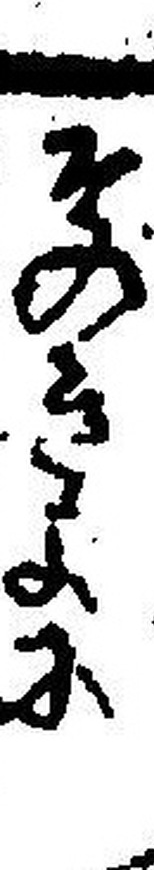そのきよに
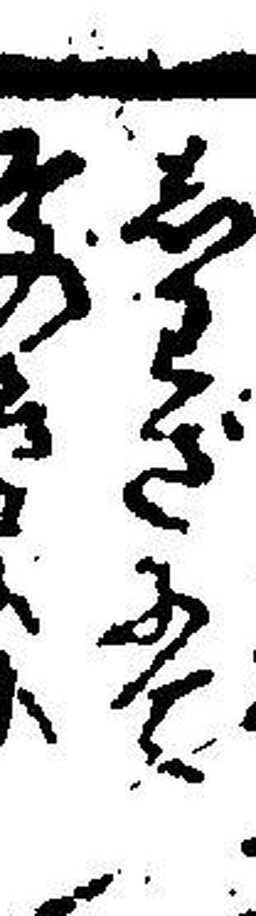そのきよに
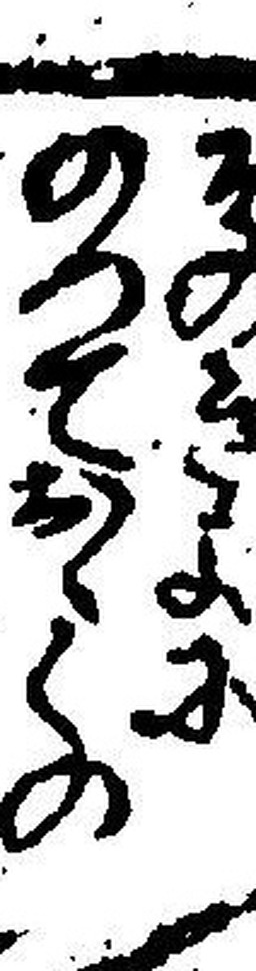のつておゝくの
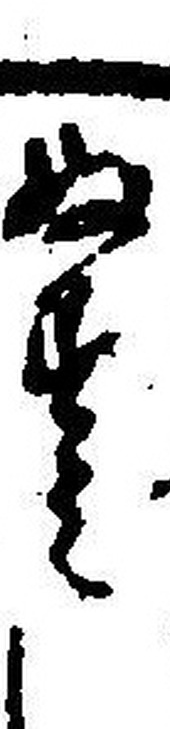ぬすみ
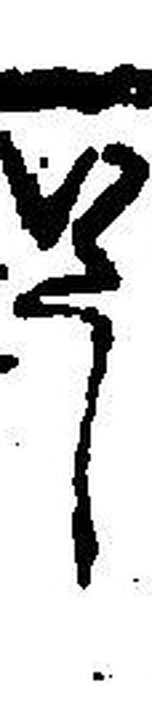いたし
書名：御代参牛時詣 / 市場通笑作
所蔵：東京大学総合図書館 General Library in the University of Tokyo, JAPAN
